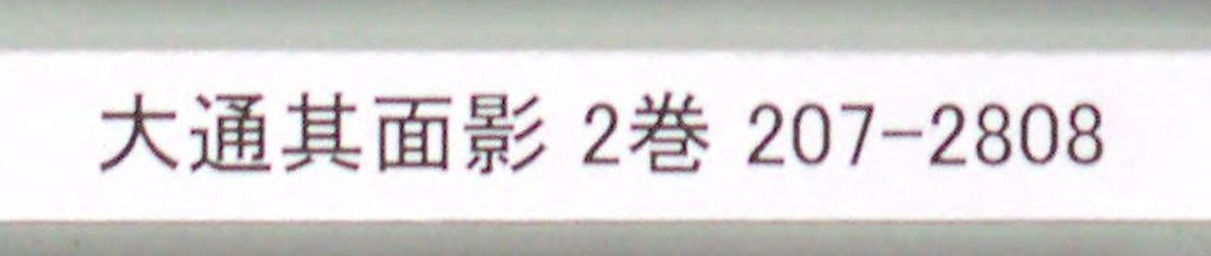大通其面影全
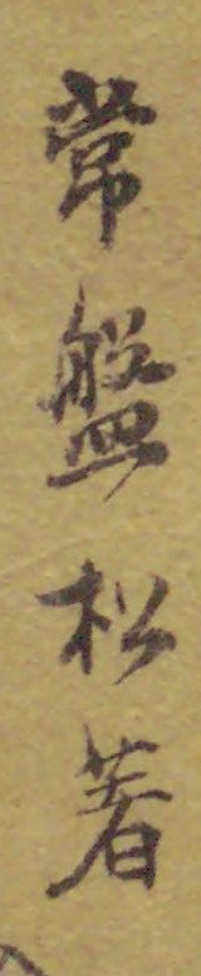常盤松著

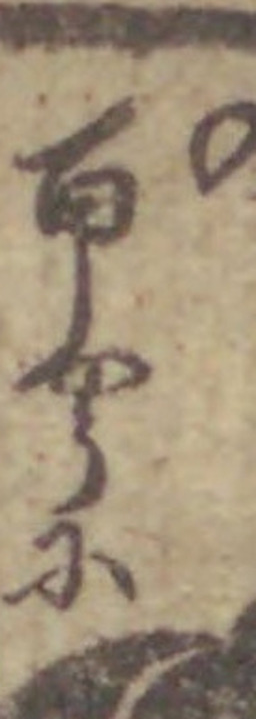百しやうに

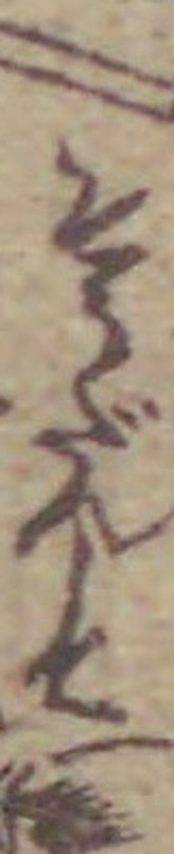そうだんして
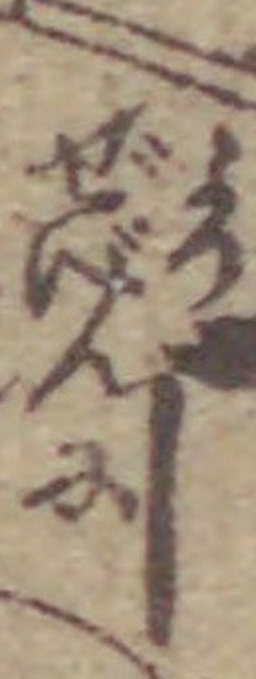ぜげんに
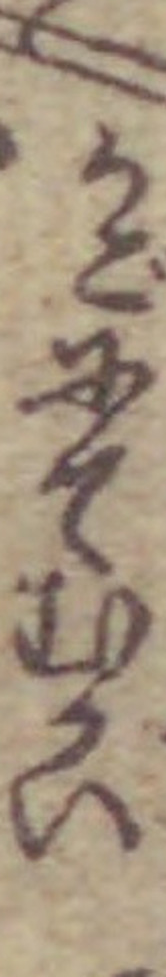かごにてむかい
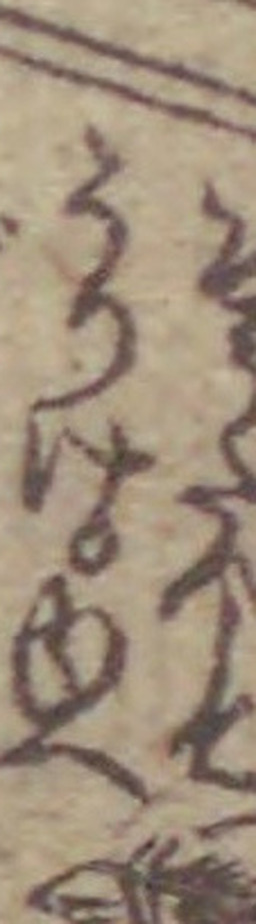うりけるゆへ
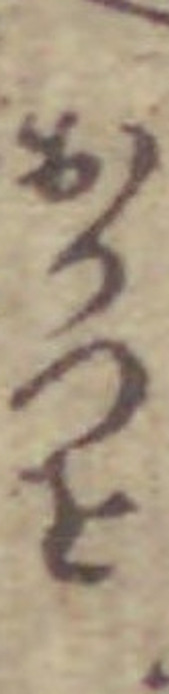おかつを
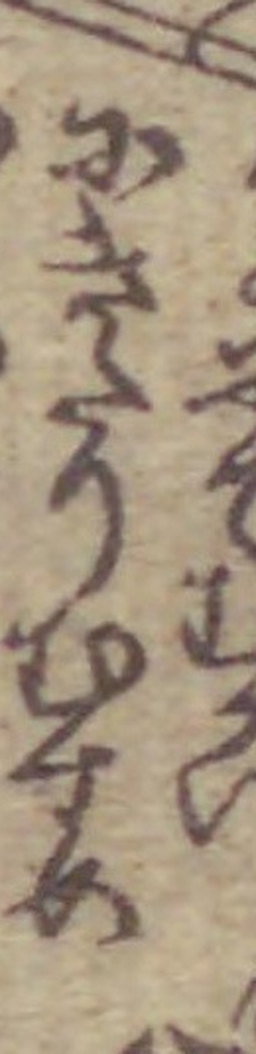にきたりむすめ
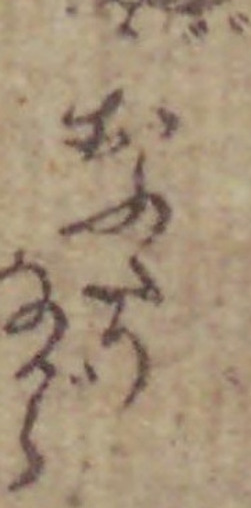おふたり
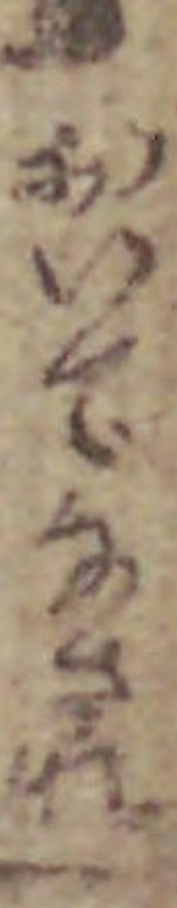おいでなされ
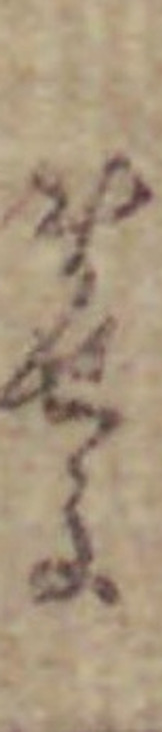ませよ
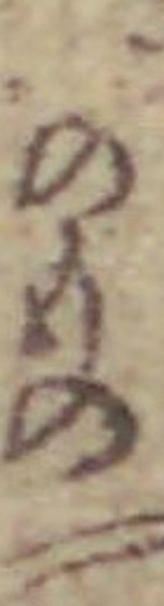のもの
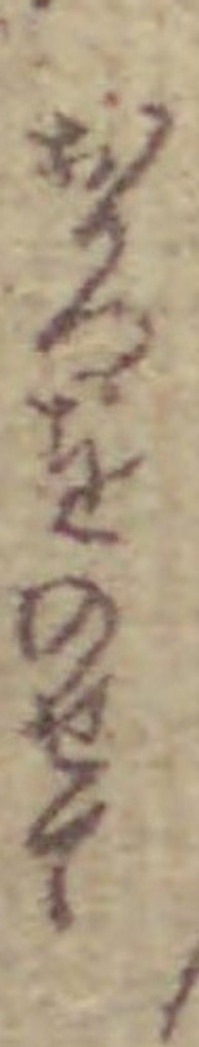おかつをのせて
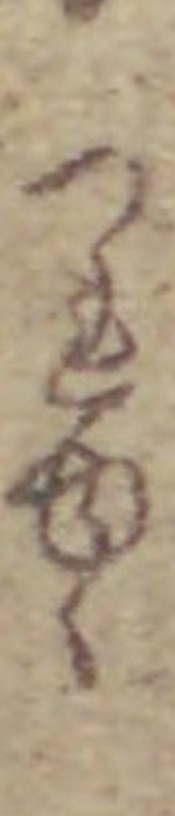つれゆく
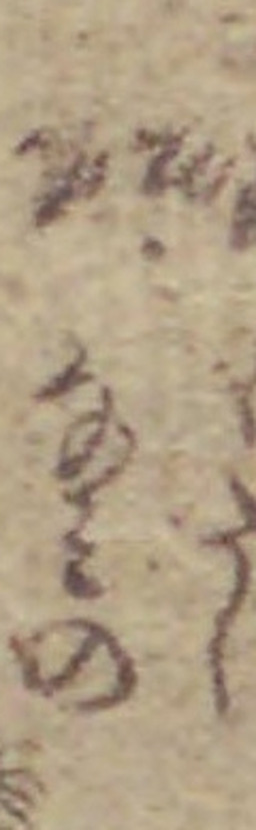なみの
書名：大通其面影 2巻
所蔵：国立国会図書館 National Diet Library, JAPAN
